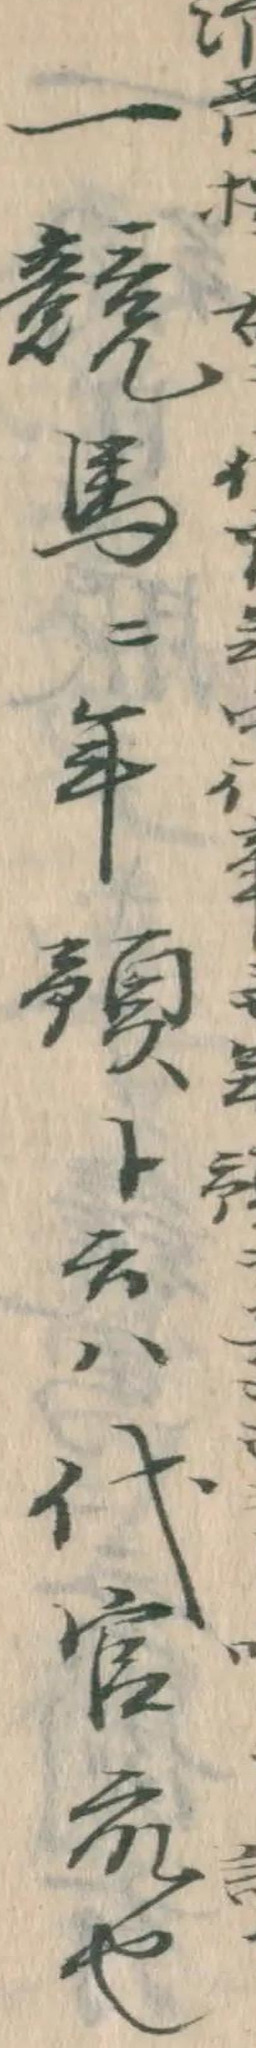一競馬ニ年預ト云ハ代官衆也

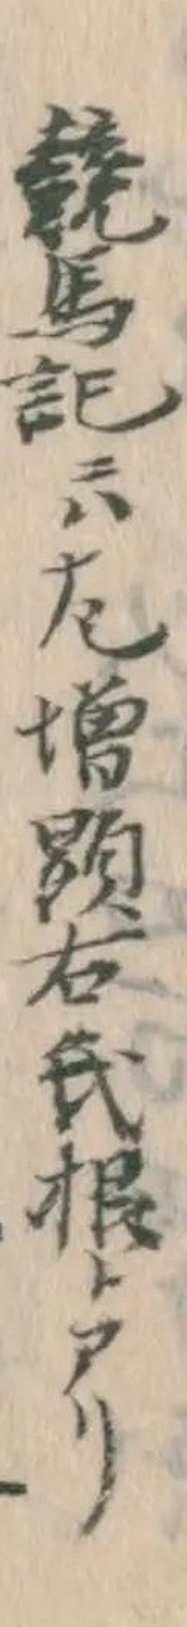競馬記二ハ左増頭右氏根トアリ
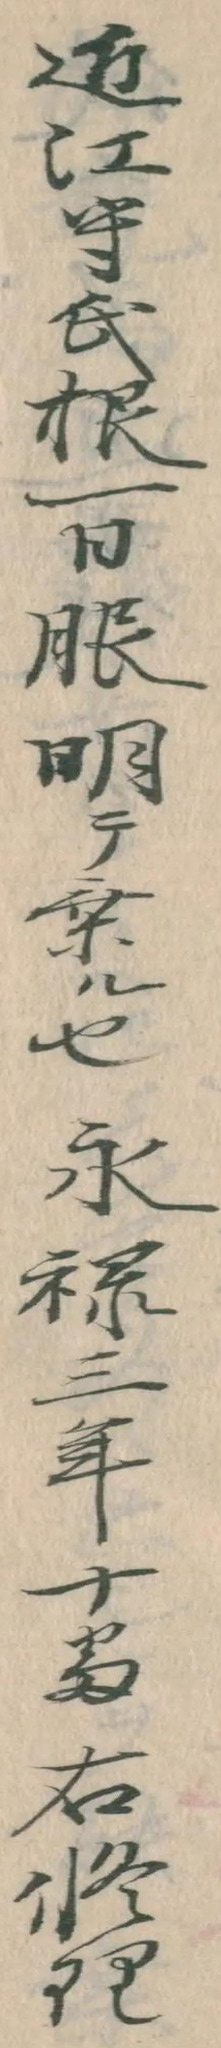近江守氏根一日服明テ乗ル也永禄三年十番右修理
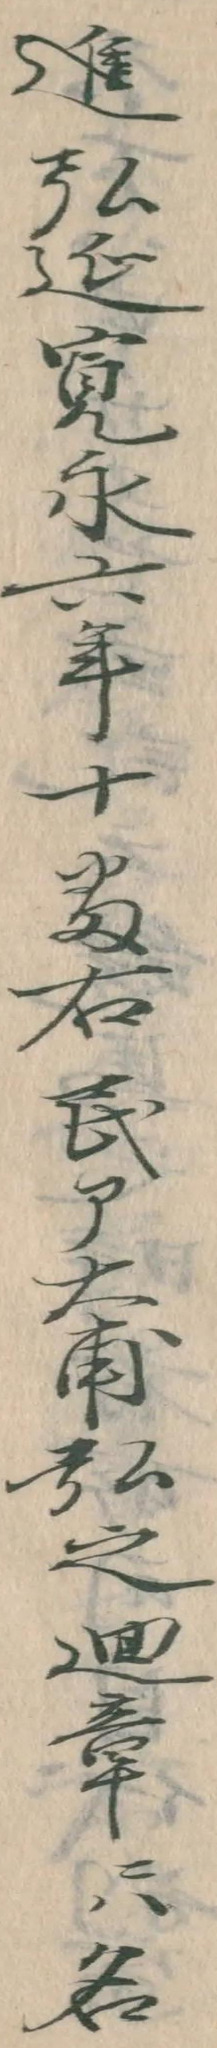進弘延寛永六年十番右民部大甫弘之廻章ニハ名
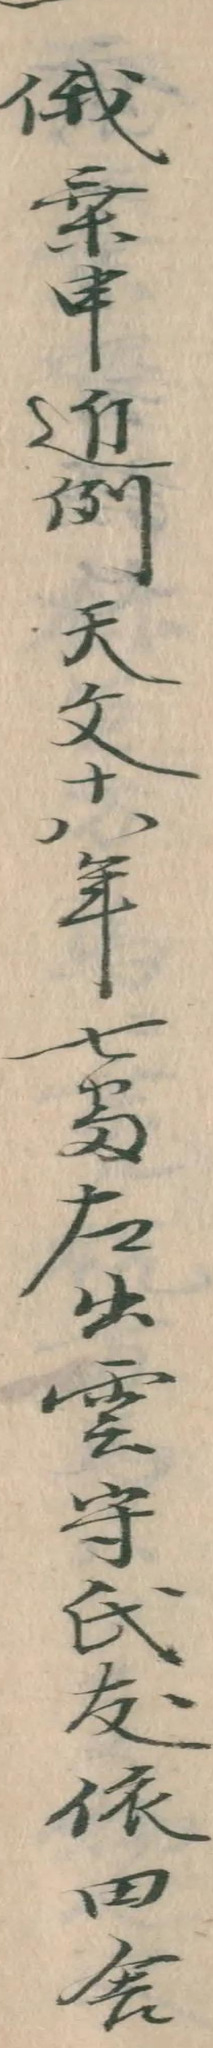一俄乗申近例天文十八年七番左出雲守氏友依田舎
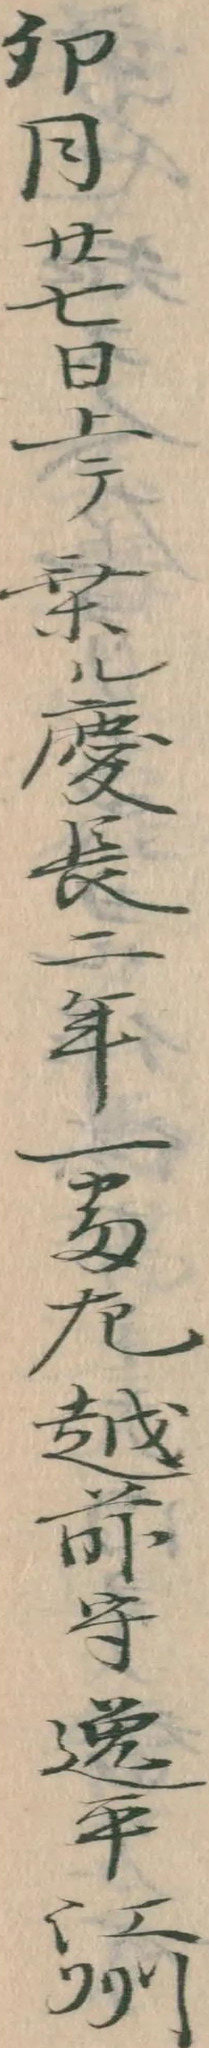卯月廿七日上テ乗ル慶長二年一番左越前守逸平江州
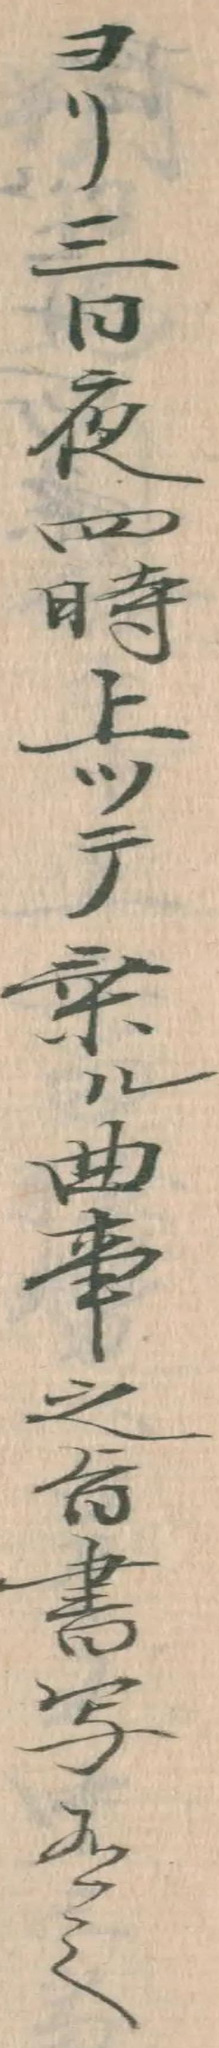ヨリ三日夜四時上ツテ乗ル曲事之旨書写有之
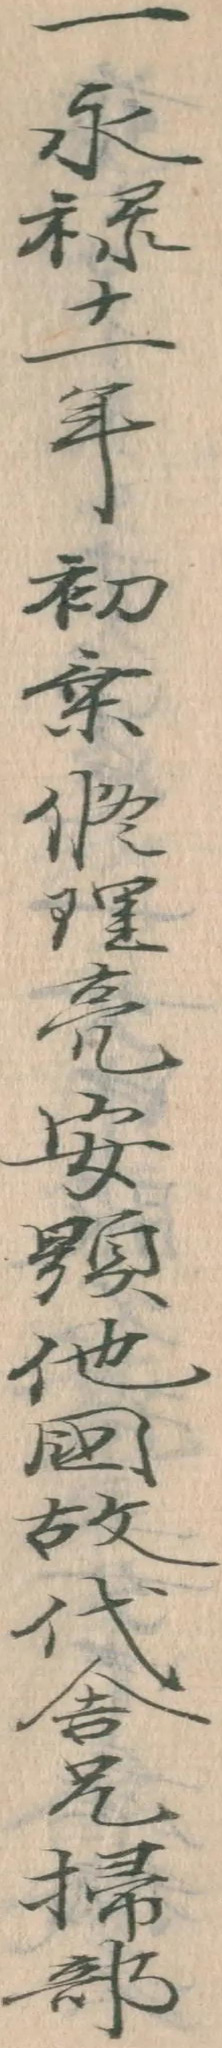一永禄十一年初乗修理亮安顕他国故代舎兄掃部
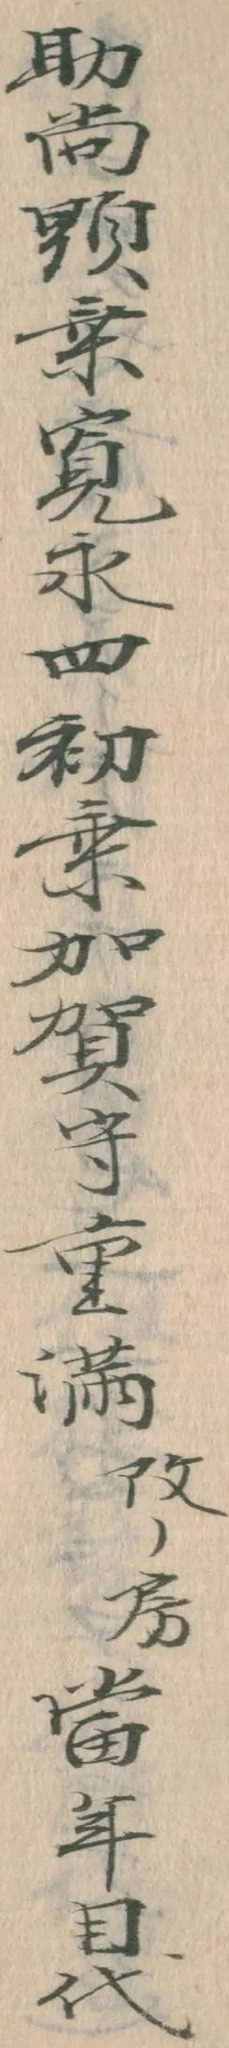助尚顕乗寛永四初乗加賀守重満改ノ房当年目代
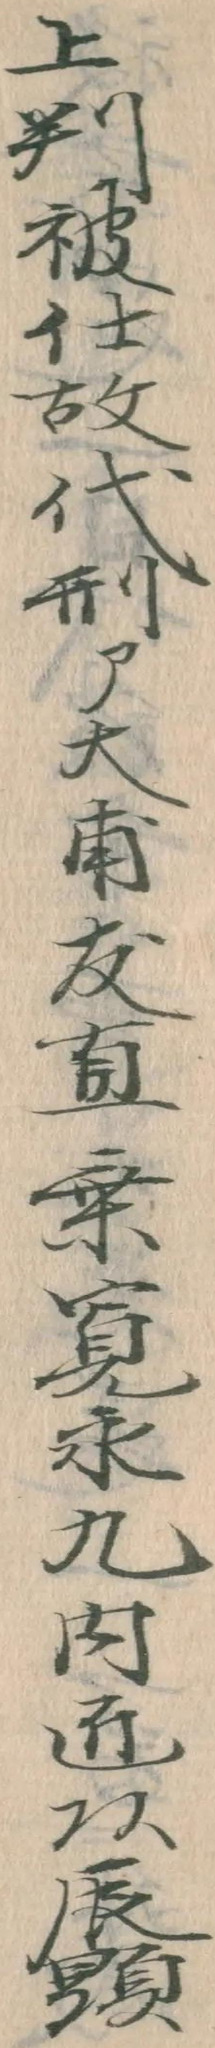上判被仕故代刑部大甫友直乗寛永九内匠頭辰顕
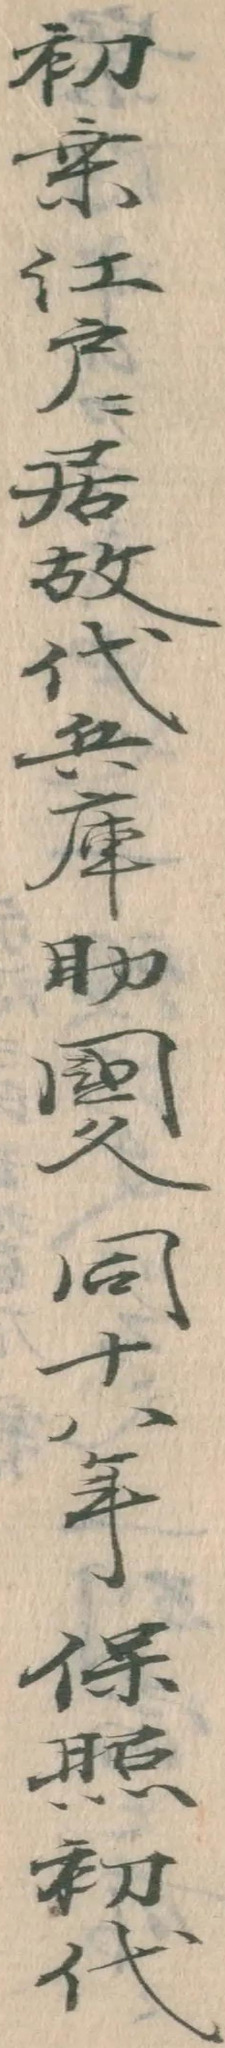初乗江戸二居故代兵庫助国久同十八年保照初代
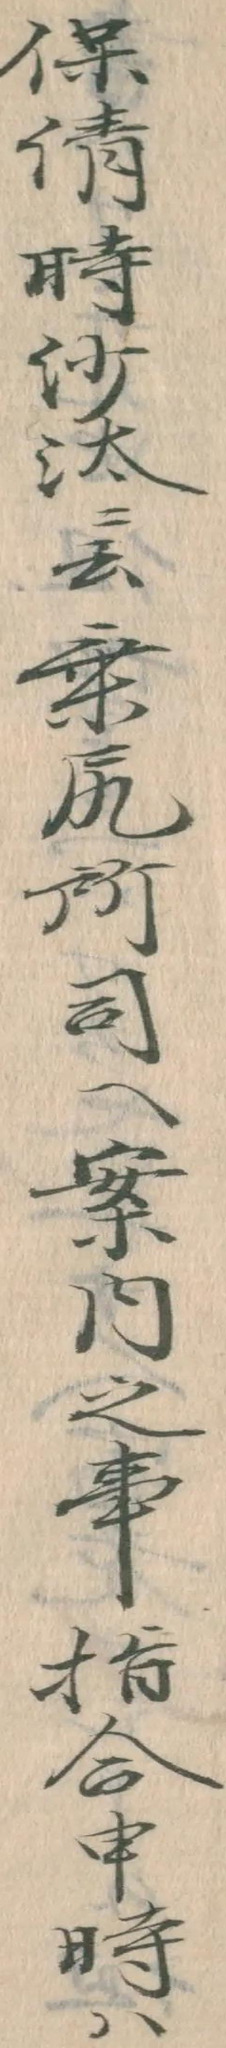保清時沙汰ニ云乗尻所司へ案内之事指合申時ハ
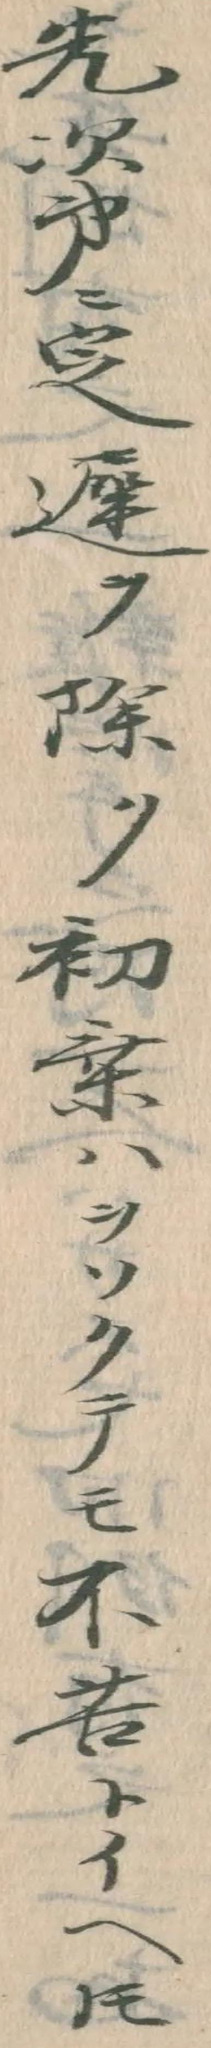先次第ニ定遅ヲ除ク初乗ハヲソクテモ不苦トイヘトモ
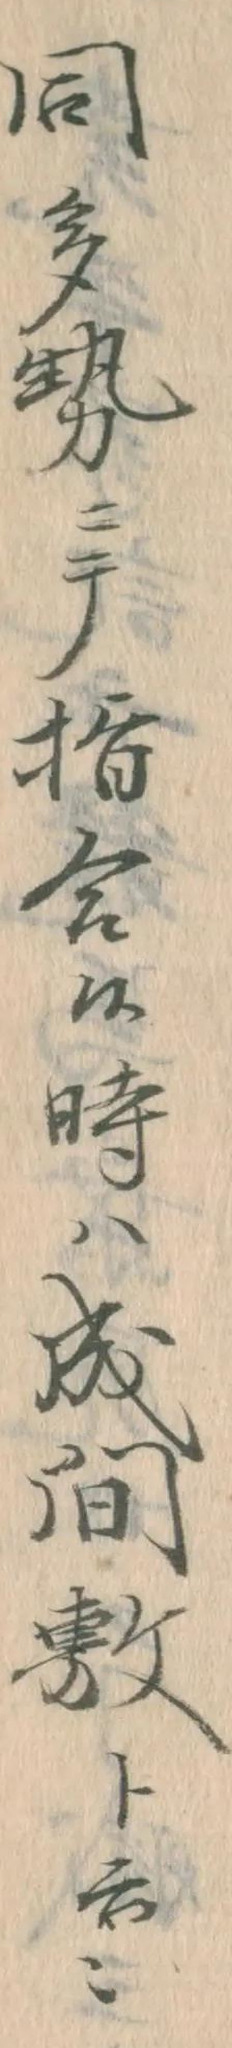同多勢ニテ指合候時ハ成間敷ト云々

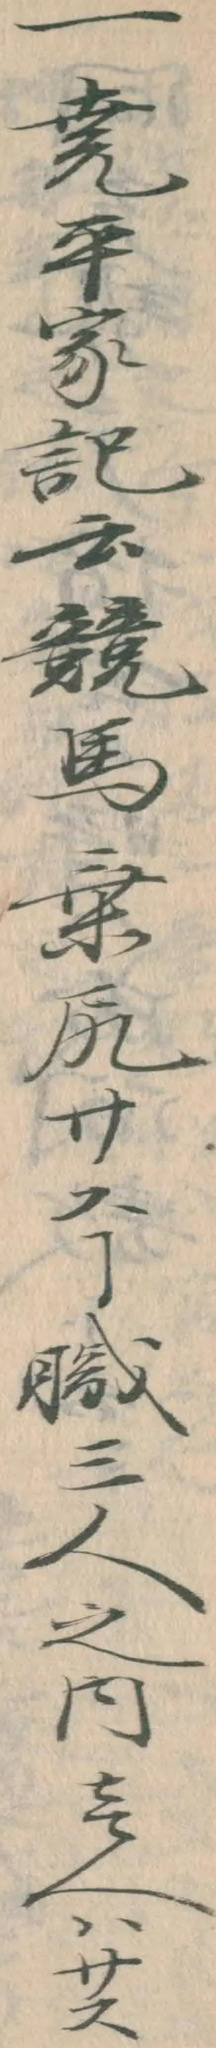一尭平家記云競馬乗尻サスコト職三人之内壱人ハサス
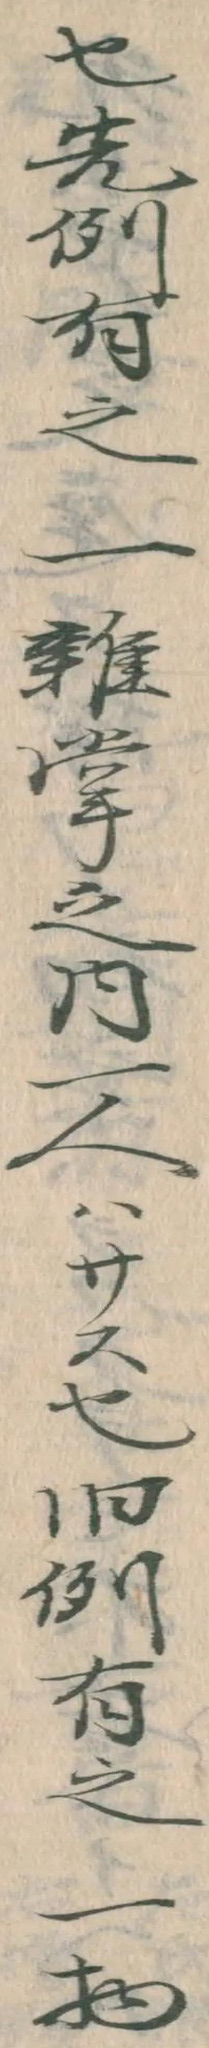也先例有之一雑掌之内一人ハサス也旧例有ノ之一物
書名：賀茂社記録. 第11冊
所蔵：国立国会図書館 National Diet Library, JAPAN
